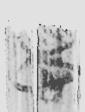𢝊（憂）
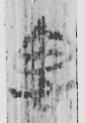思
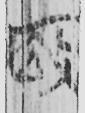{医殳}
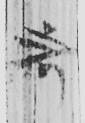先
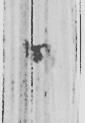人
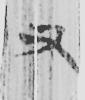又
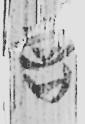言
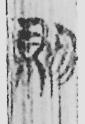則
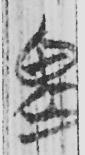畏
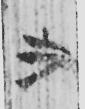之
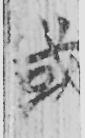或
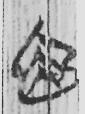因
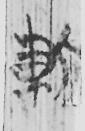斬
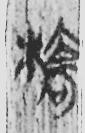椅
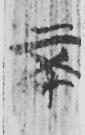不
